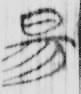昜（陽）
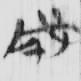成（城）
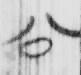公
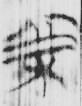样
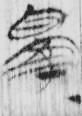睪
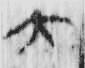大
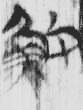○（漁）
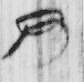尹
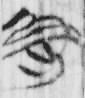○（屈）
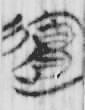○（達）
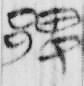郫
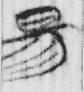昜（陽）
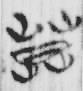莫
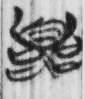囂
